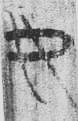女（如）
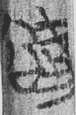欲
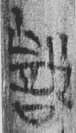○（察）
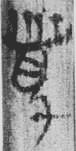○（一）
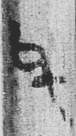卬（仰）
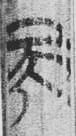而
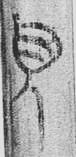視
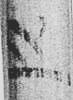之
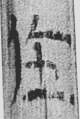○（俯）
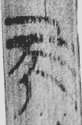而
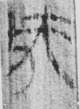癸（揆）
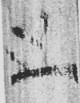之
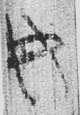母（毋）
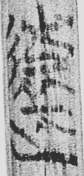遠
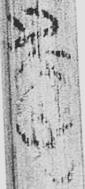○（求）
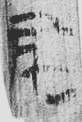厇
